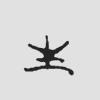生
